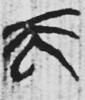而
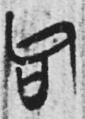句（後）
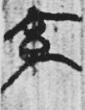交
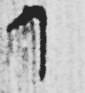人
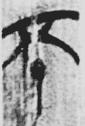不
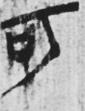可
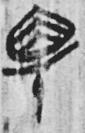觕（觸）
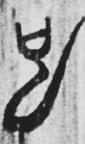也
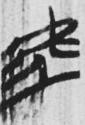○（吾）
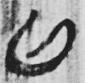㠯（以）
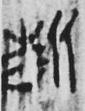折（杕）
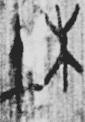杜
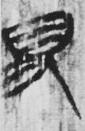○（得）
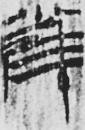雀（爵）
